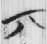亓（其）
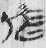倌
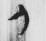人
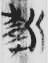新
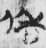俈
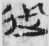○（卜）
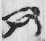尹
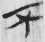不
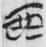爲
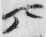亓（其）
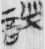○（察）
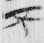不
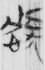憖
